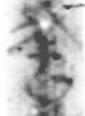尹
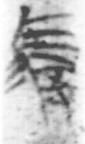馭（御）
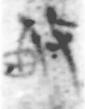○（畋）
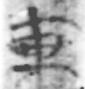車
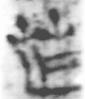苲
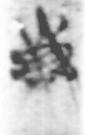兼
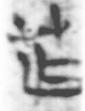苲
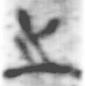之
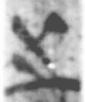之
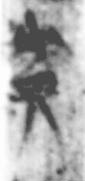貧（紛）
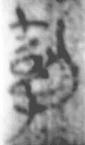韌
